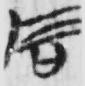石
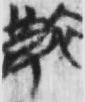被
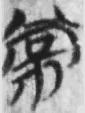常（裳）
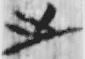之
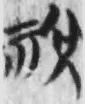敓
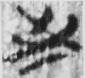至
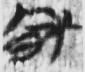秋
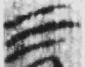三
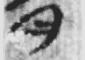月
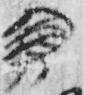賽
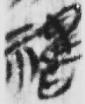禱
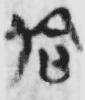卲
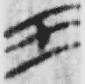王
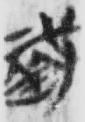戠
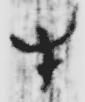牛
